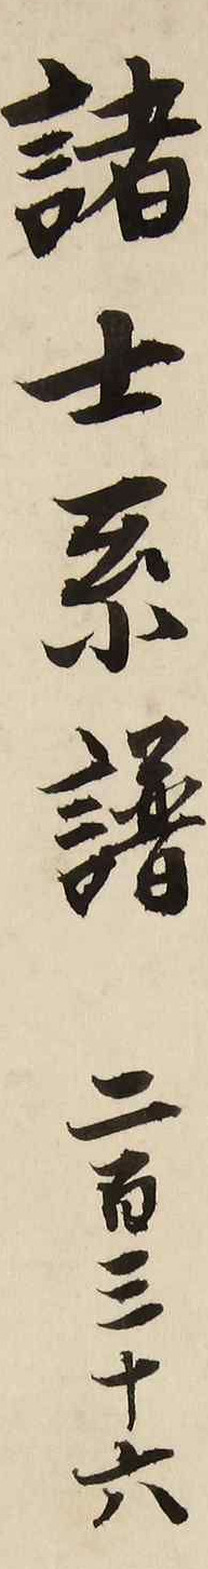諸士系譜二百三十六

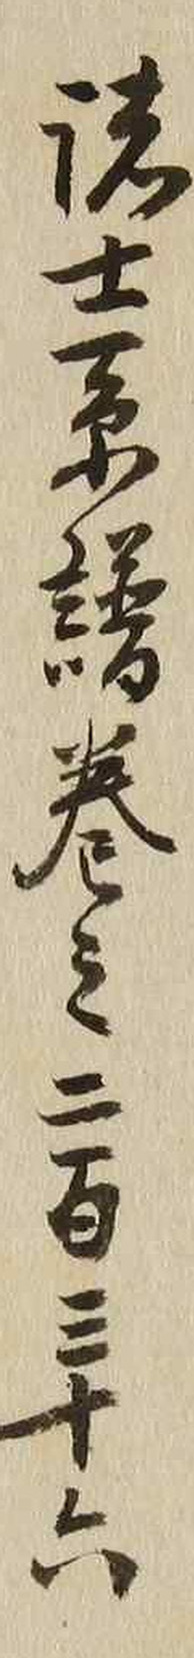諸士系譜巻之二百三十六
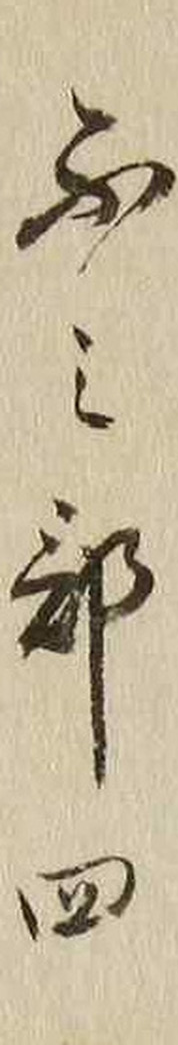ふ之部四
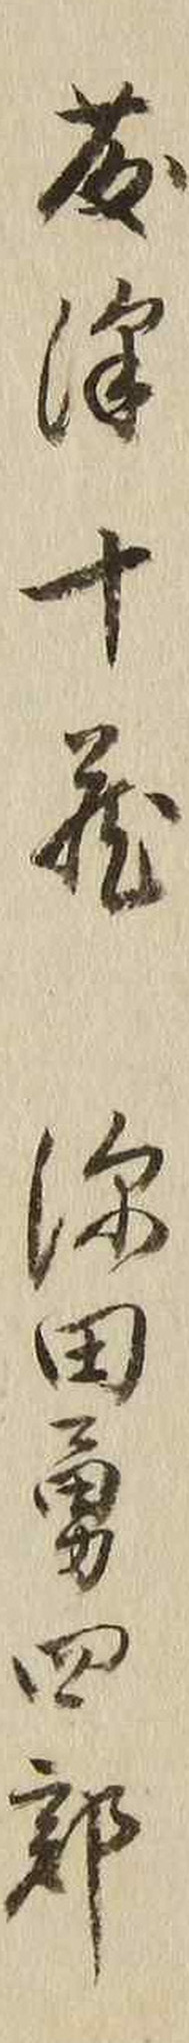藤沢十蔵深田勇四郎
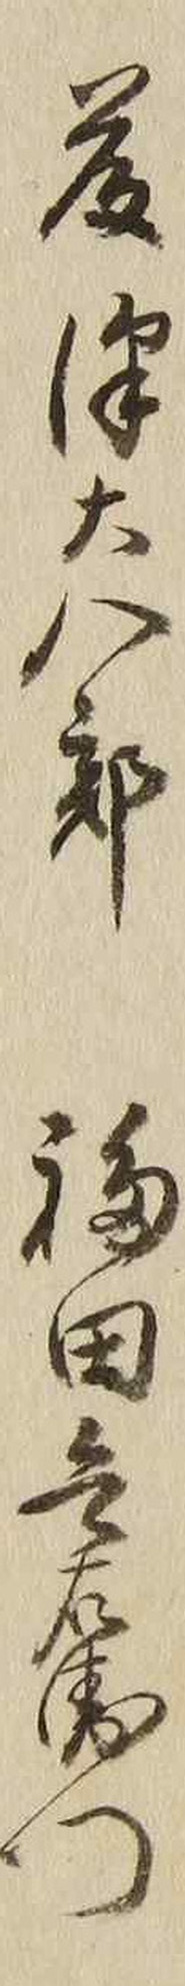藤沢大八郎福田兵右衛門
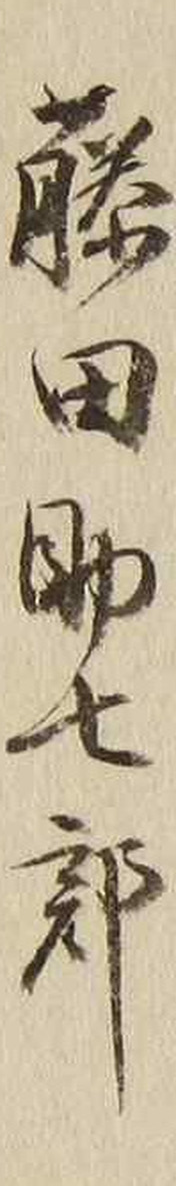藤田助七郎

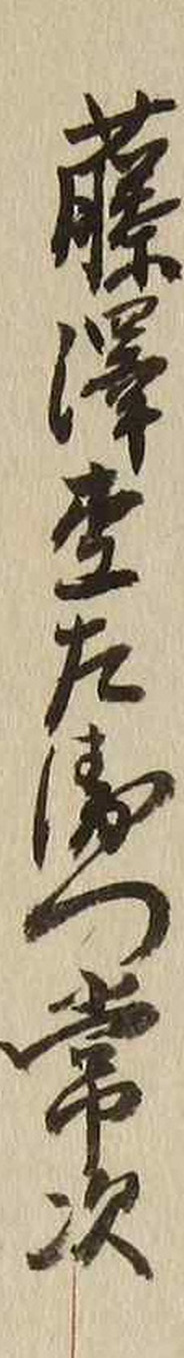藤沢杢左衛門常次
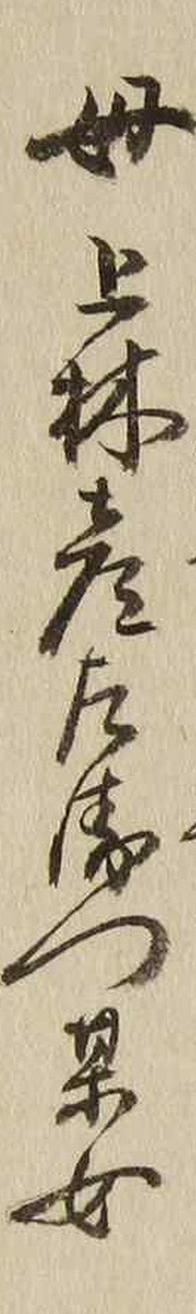母上林彦左衛門某女
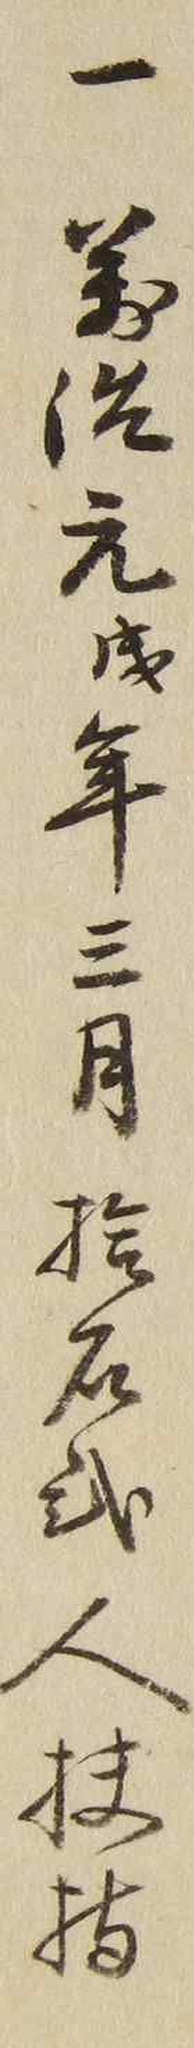一万治元戌年三月拾石弐人扶持

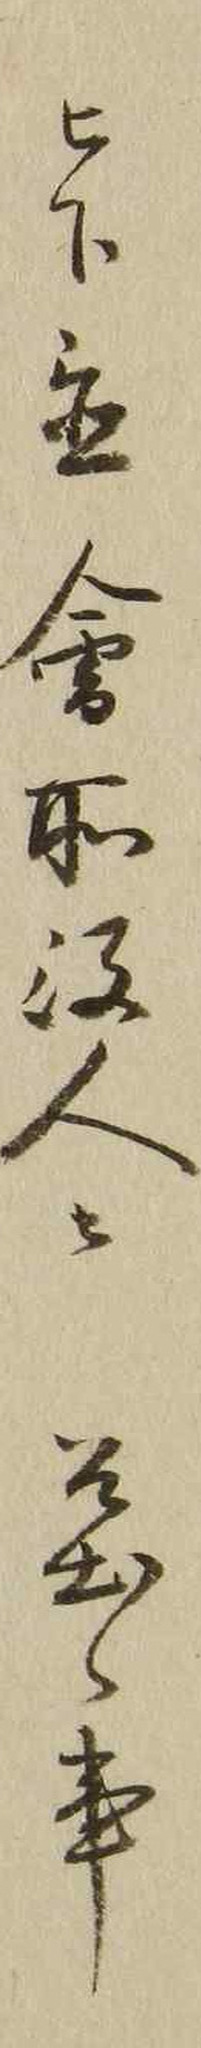被下置会所役人被召出候事
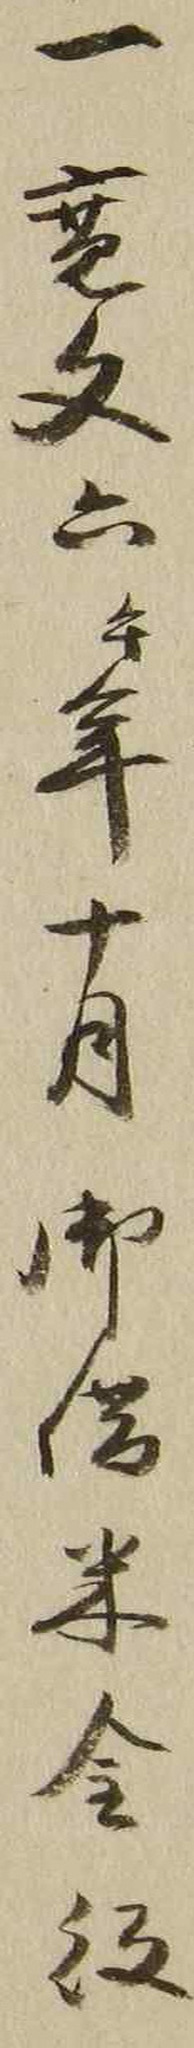一寛文六午年十月御借米金役
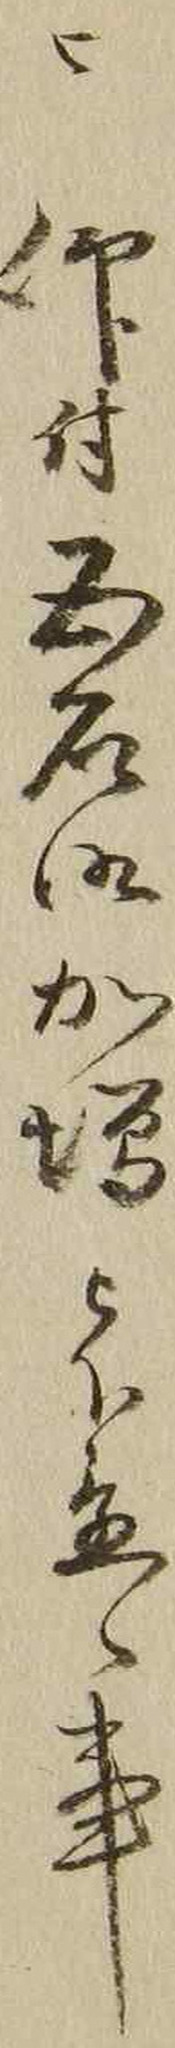被仰付五石御加増被下置候事
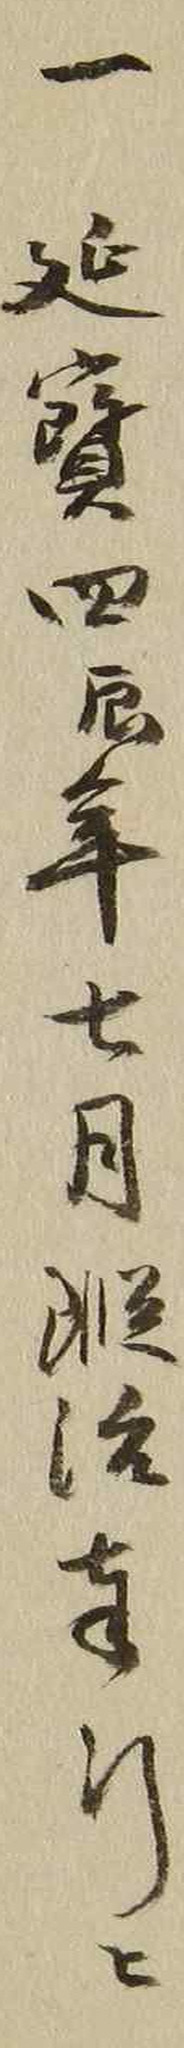一延宝四辰年七月鍛冶奉行被
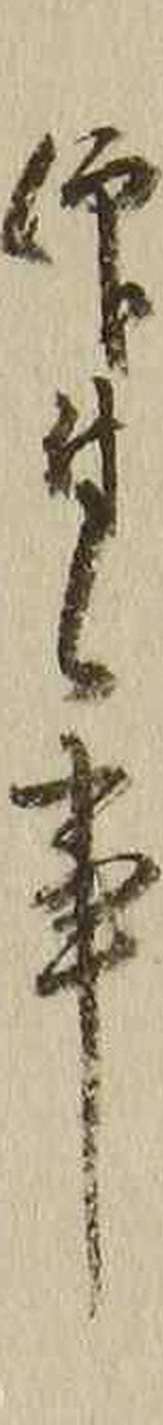仰付候事
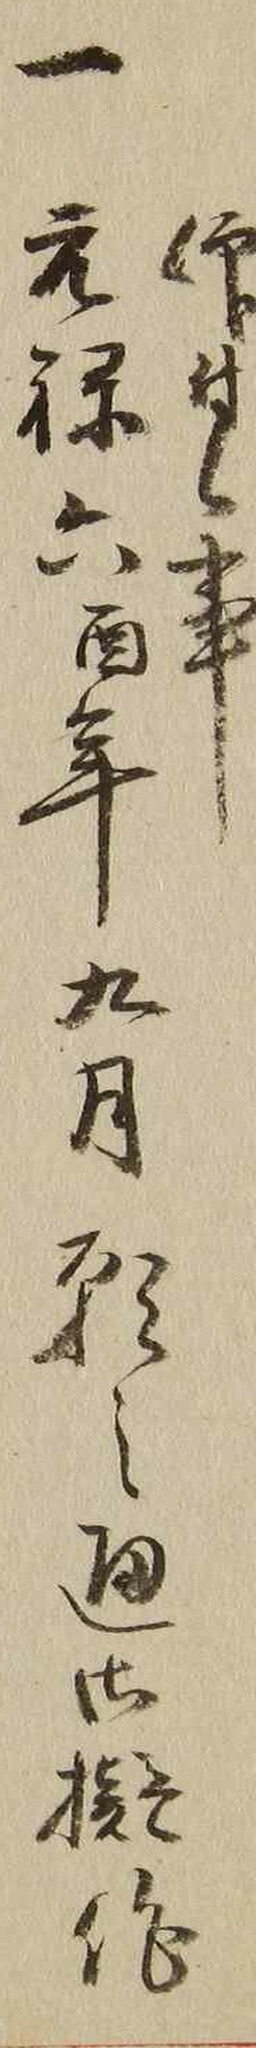一元禄六酉年九月願之通御擬作
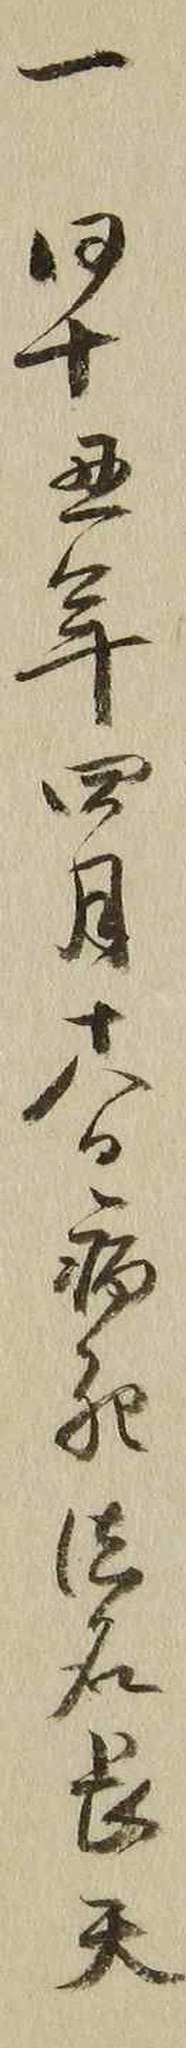一同十丑年四月十八日病死法名長天
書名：諸士系譜　巻之236　ふ之部4
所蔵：会津若松市立会津図書館
